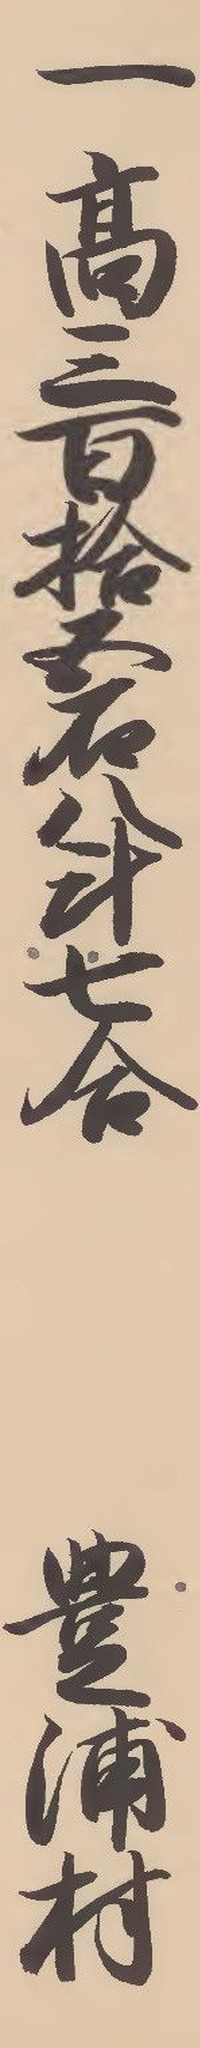一高三百拾五石八斗七合豊浦村
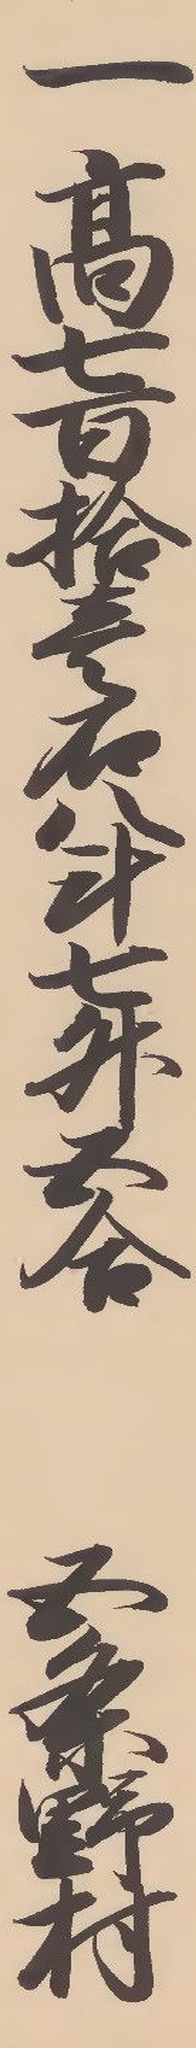一高七百拾壱石八斗七升五合五条野村
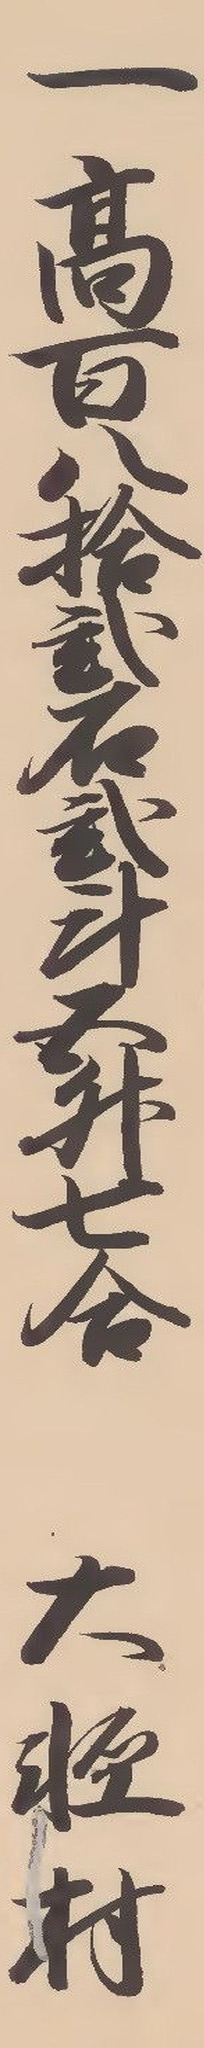一高百八拾弐石弐斗五升七合大軽村
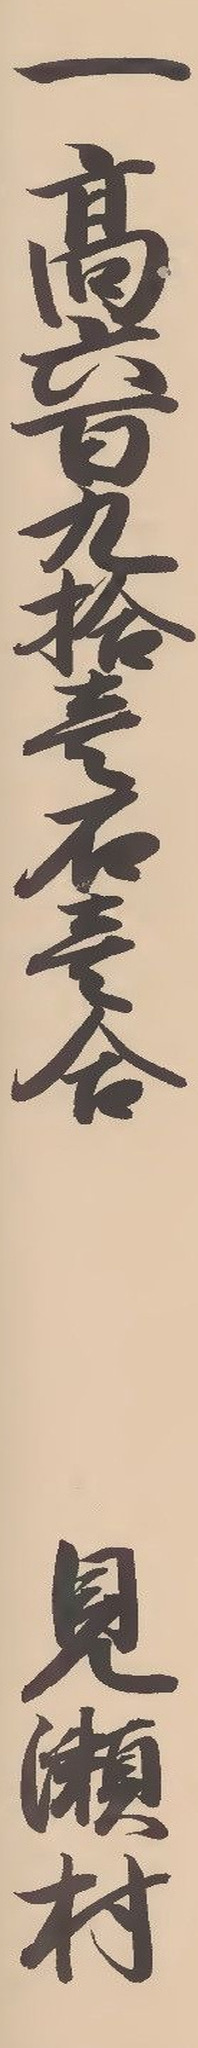一高六百九拾壱石壱合見瀬村
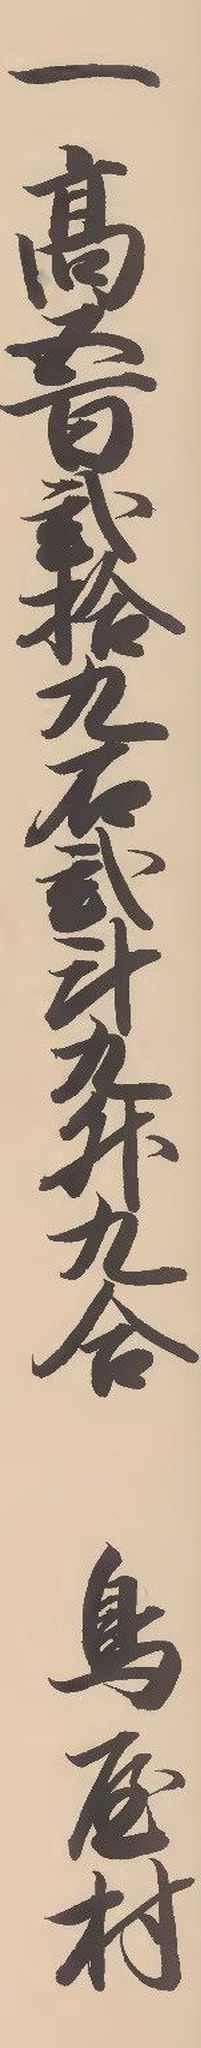一高五百弐拾九石弐斗九升九合鳥屋村
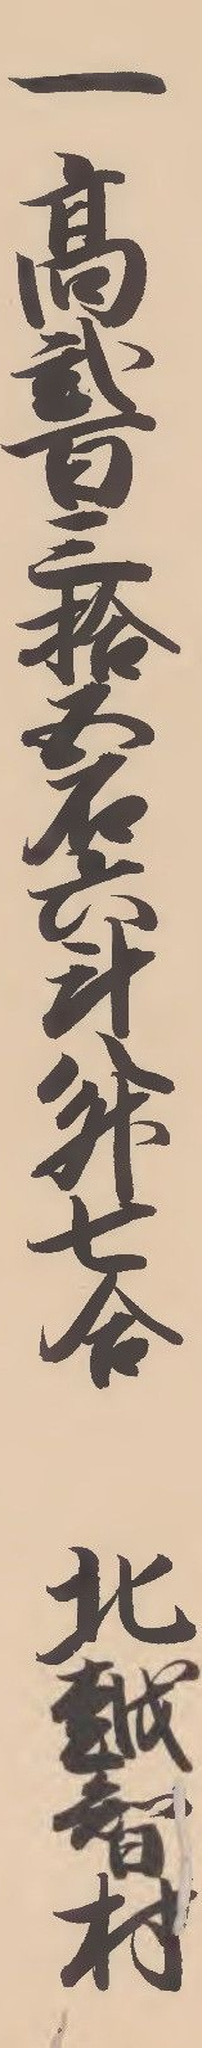一高弐百三拾五石六斗八升七合北越智村
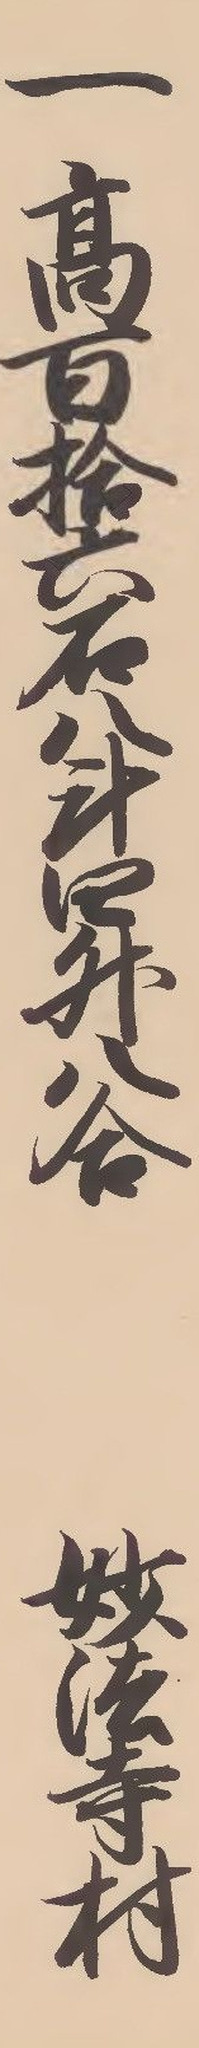一高百拾六石八斗四升八合妙法寺村
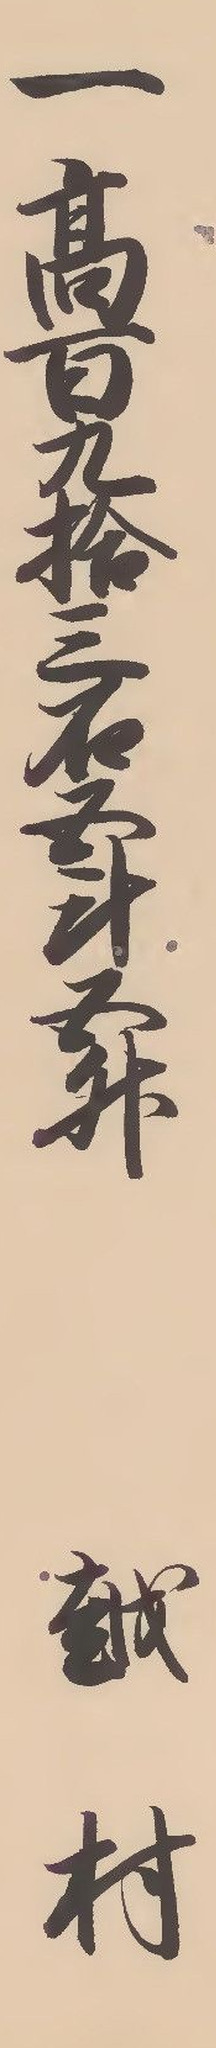一高百九拾三石五斗五升越村

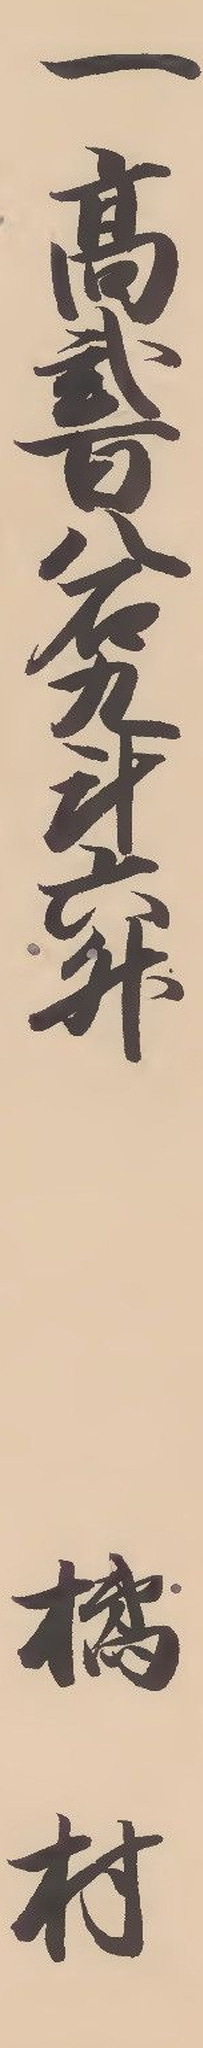一高弐百八石九斗六升橘村
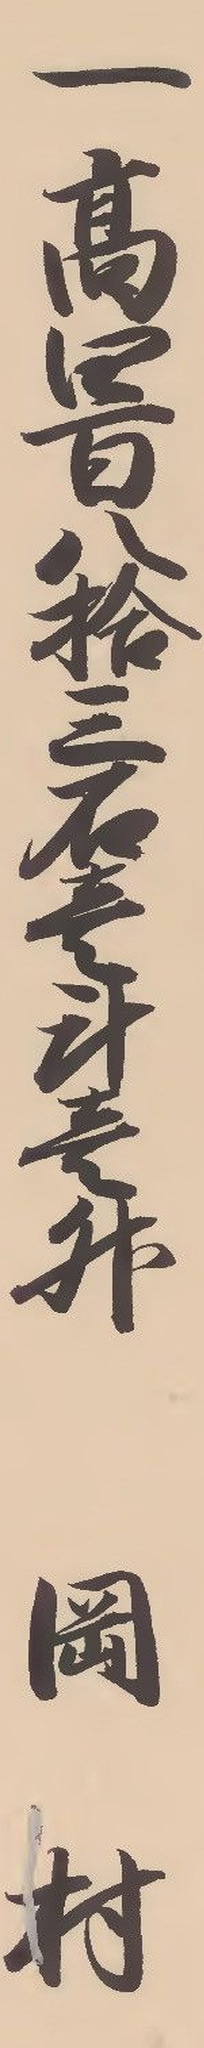一高四百八拾三石壱斗壱升岡村
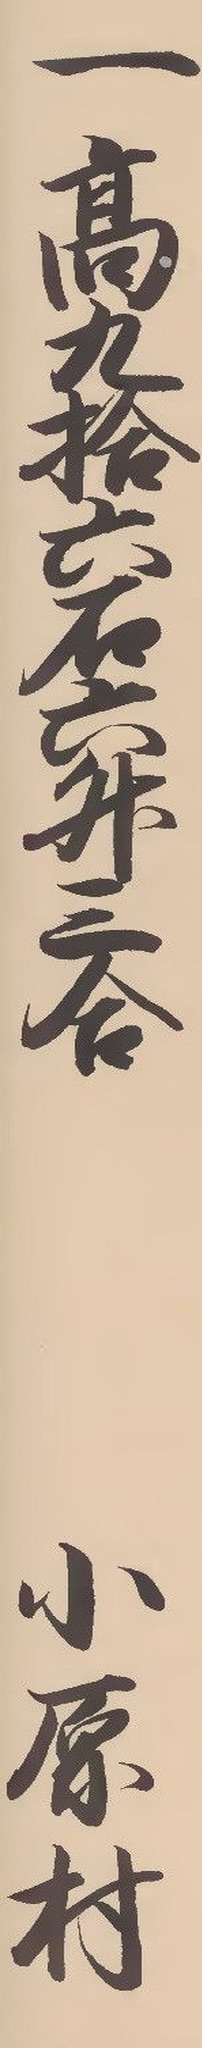一高九拾六石六升三合小原村
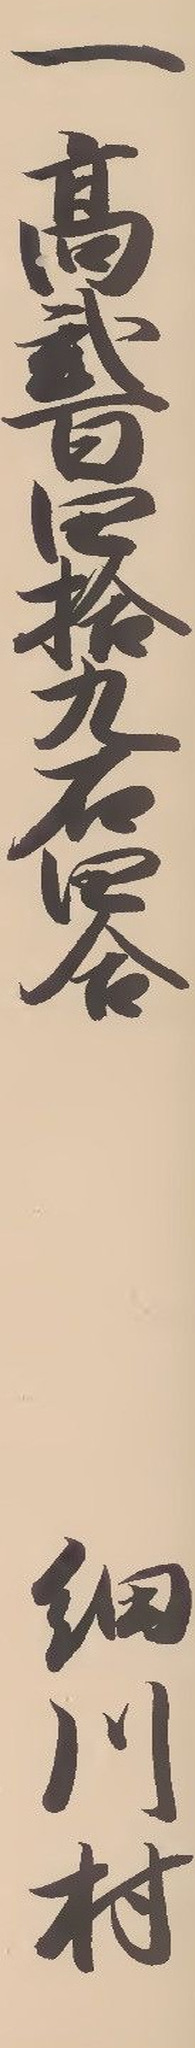一高弐百四拾九石四合細川村
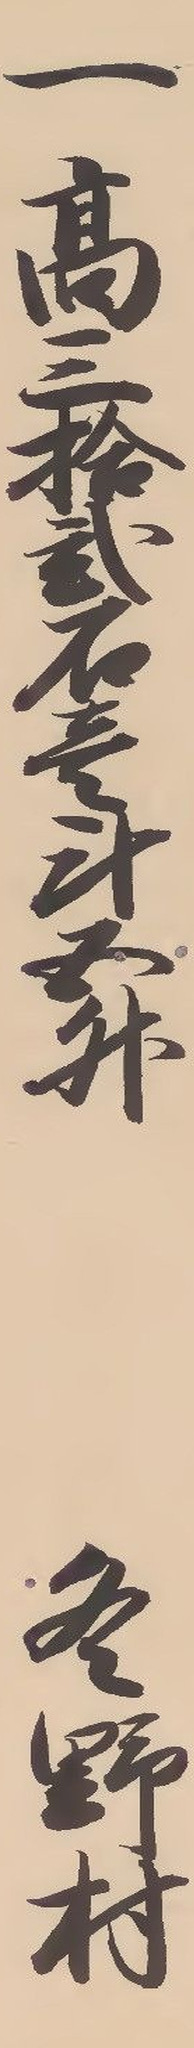一高三拾弐石壱斗五升冬野村

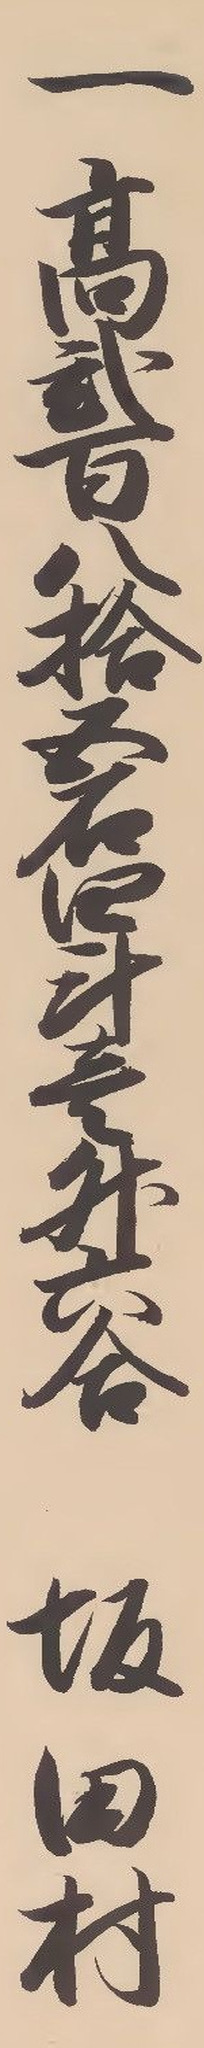一高弐百八拾五石四斗壱升六合坂田村
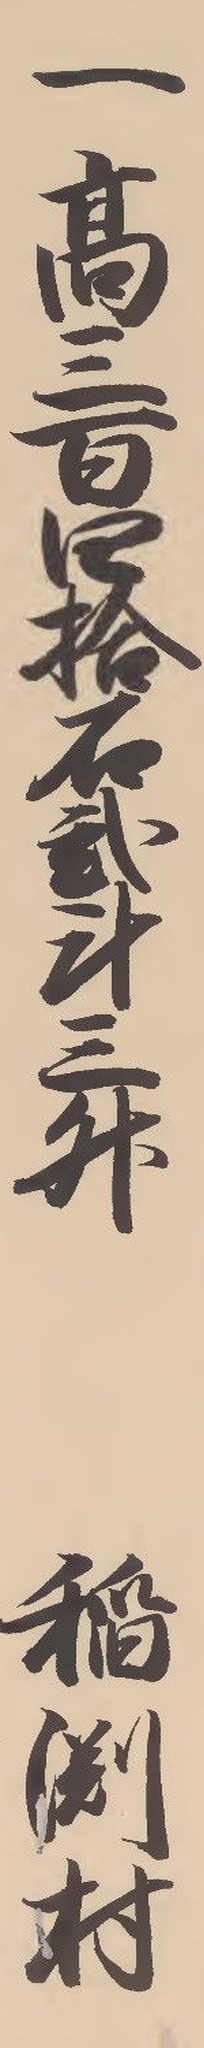一高三百四拾石弐斗三升稲渕村
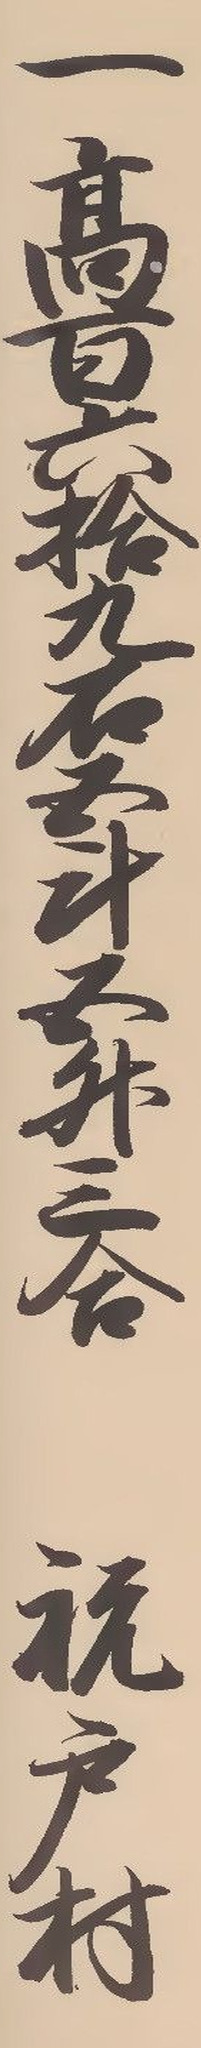一高百六拾九石五斗五升三合祝戸村
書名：大和国郷帳
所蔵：国立公文書館 National Archives of Japan
